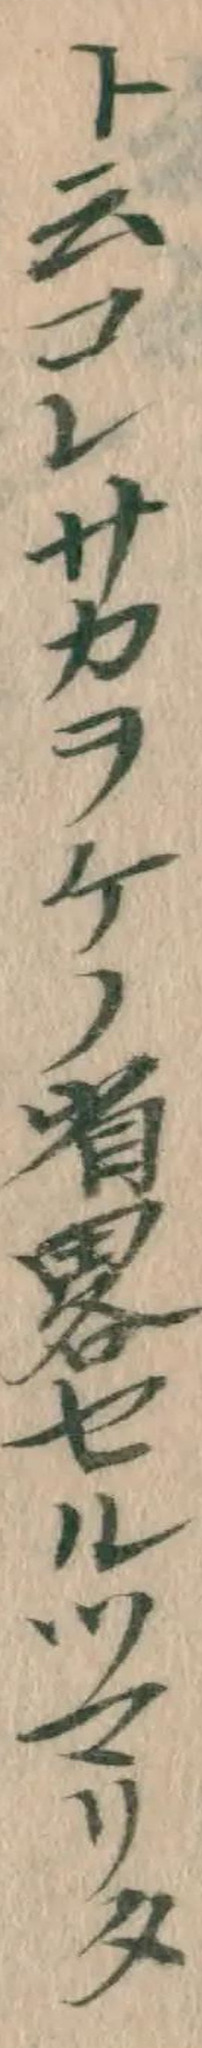ト云コレサカヲケノ省畧セルツマリタ
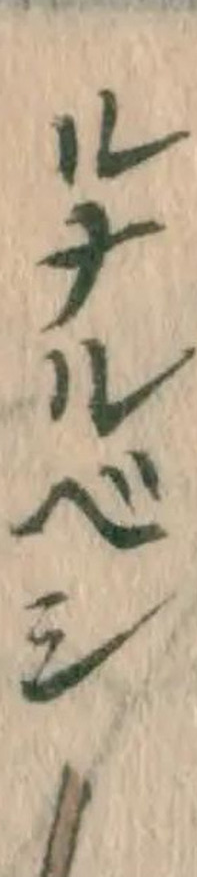ルナルベシ
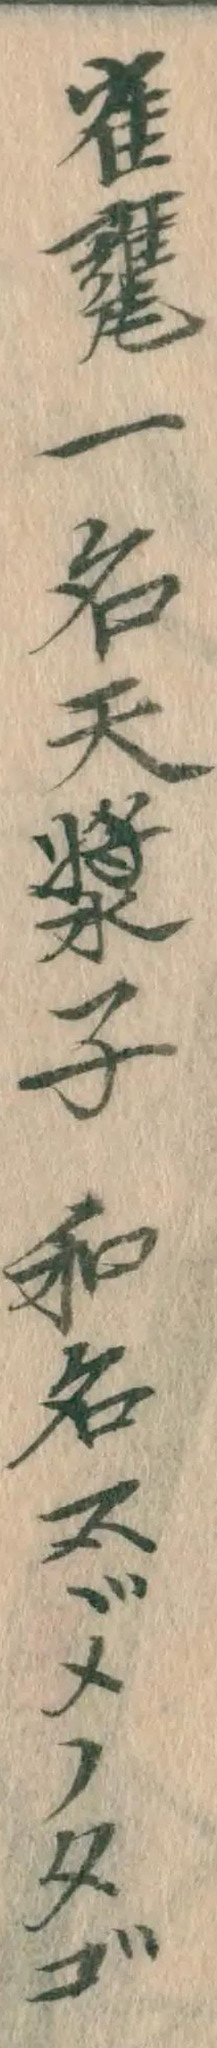雀甕一名天漿子和名スヾメノタゴ

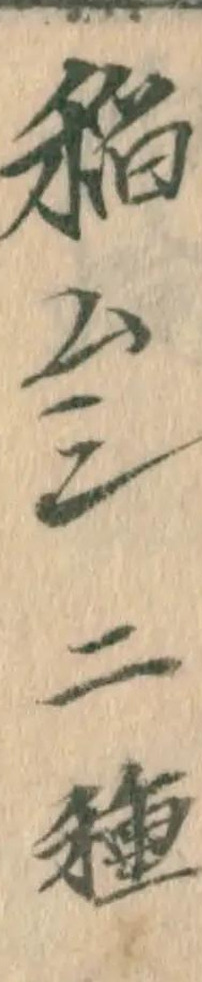稲ムシ二種
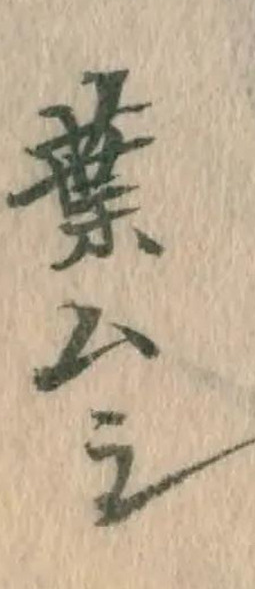葉ムシ
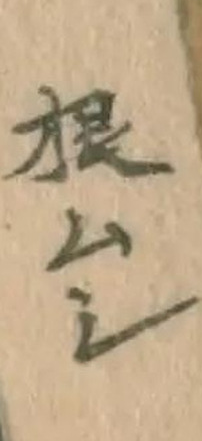葉ムシ
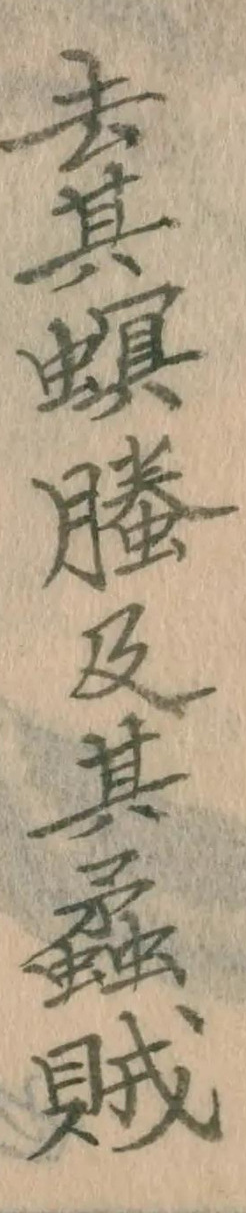去其螟螣及其蟊賊
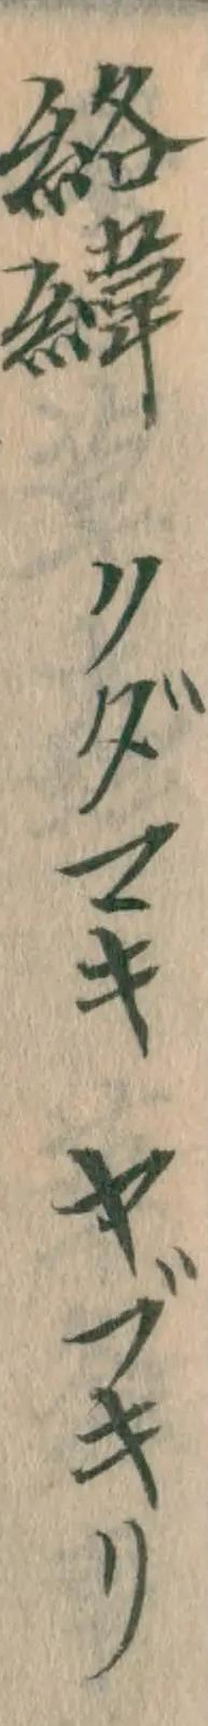絡緯クダマキヤブキリ
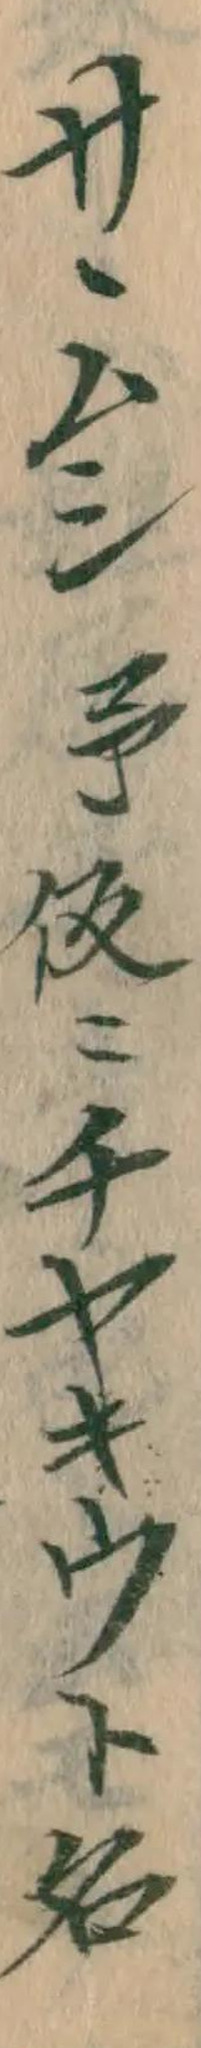サヽムシ予仮ニチヤキウト名
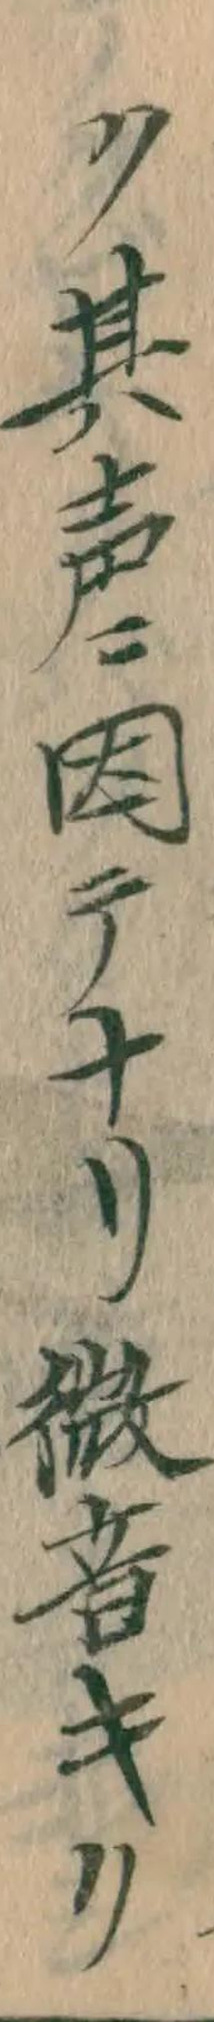ク其声ニ因テアリ微音キク
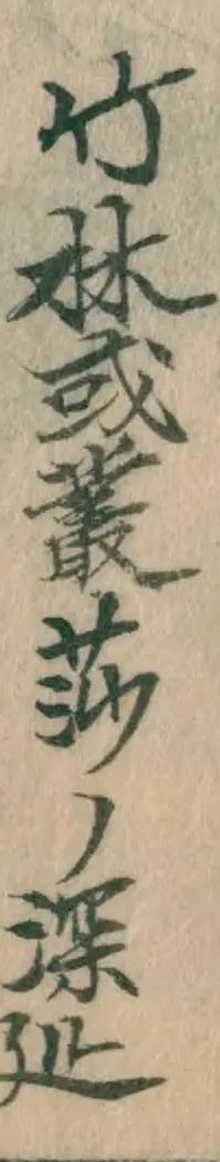竹林或叢莎ノ深処
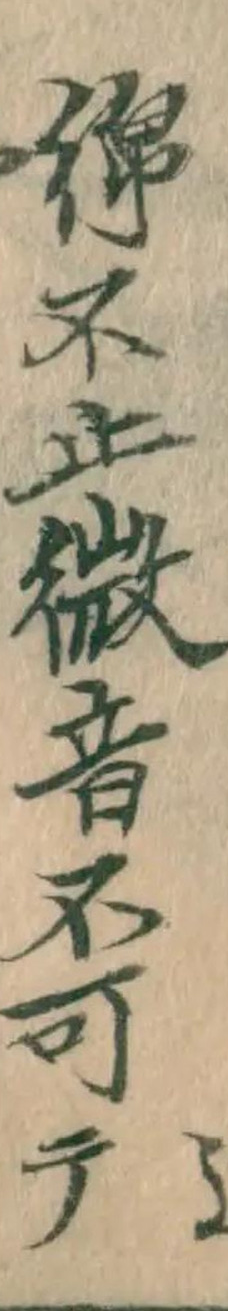綿不止微音不可テ

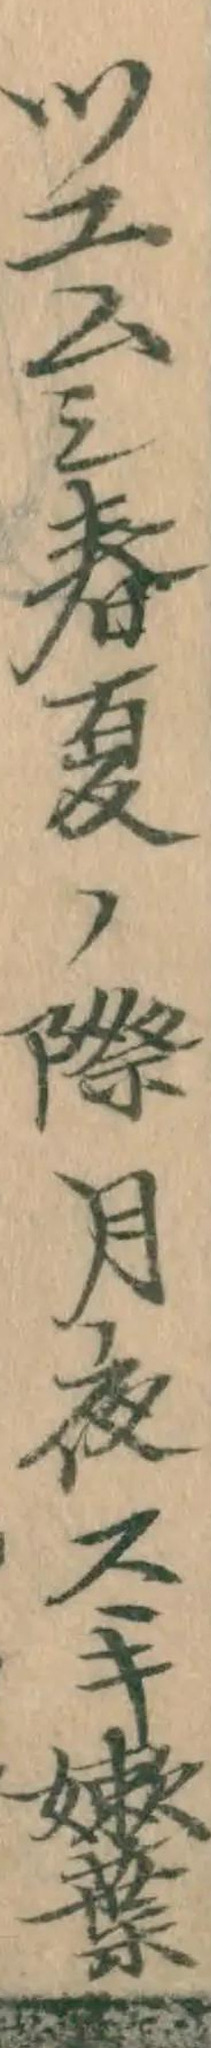ツユムシ春夏ノ際月夜スヽキ嫰葉
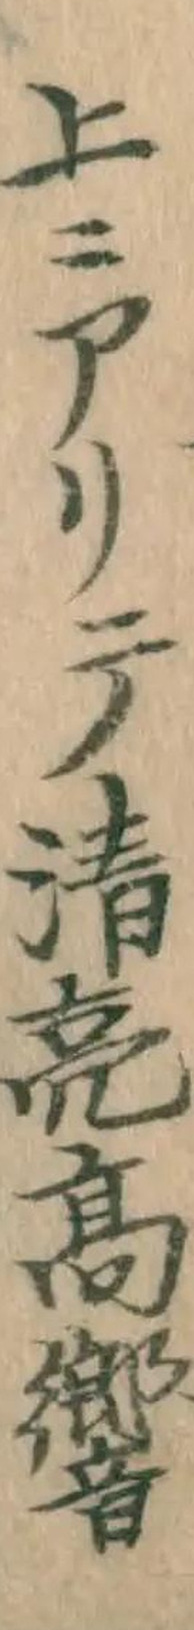上ニアリテ清亮髙響
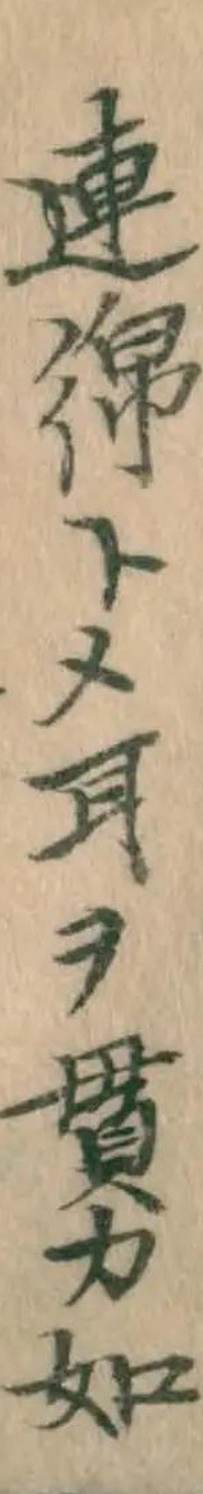連綿トシテ耳ヲ貫カ如
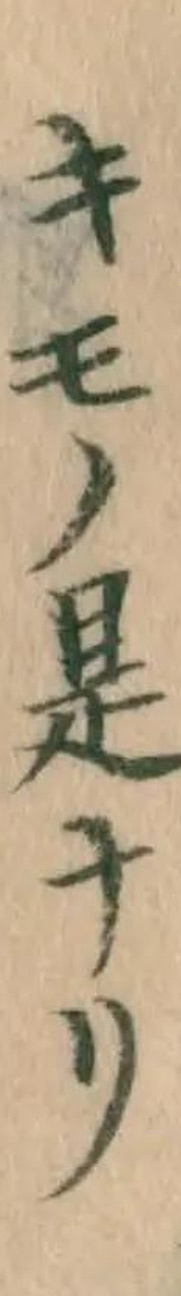キモノ是ナリ
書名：千蟲譜 3巻. [2]
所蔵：国立国会図書館 National Diet Library, JAPAN
